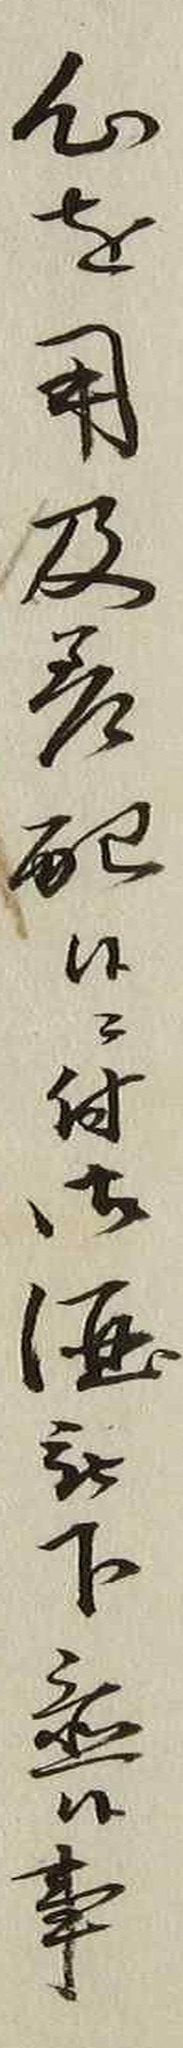心を用及差配候ニ付御酒被下置候事
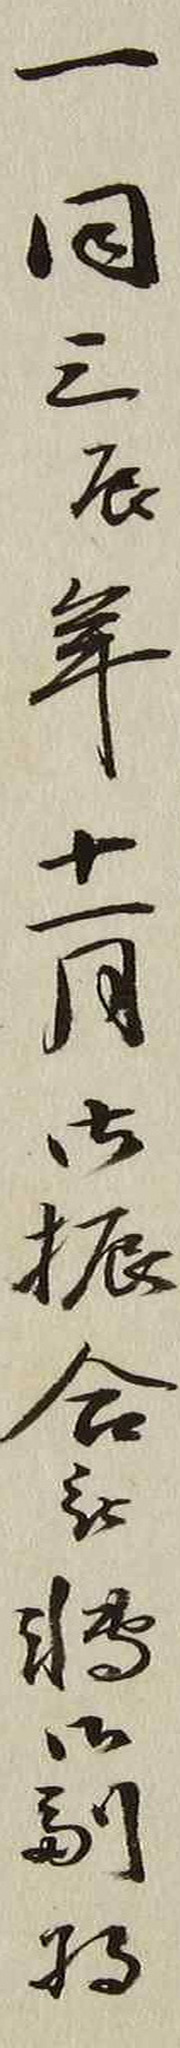一同三辰年十一月御振合被転御副将
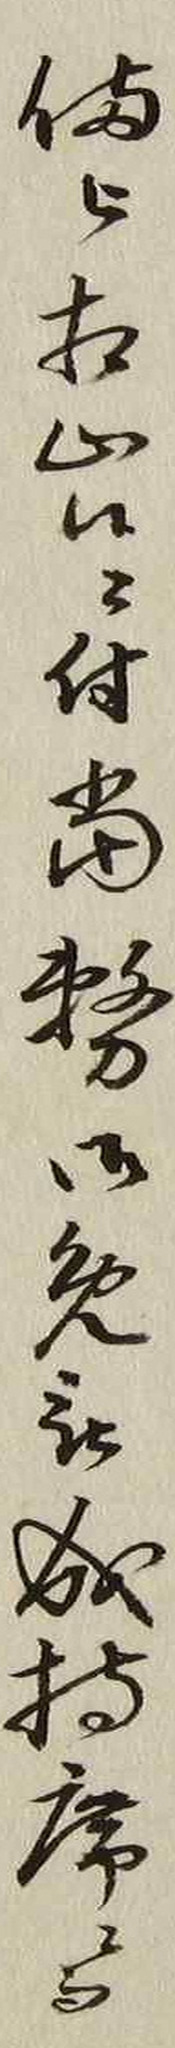へ被相止候ニ付当務御免被成持席二而
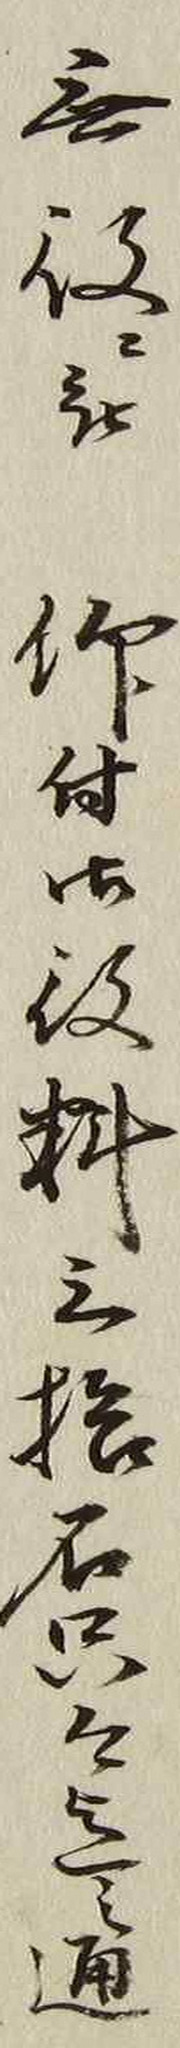無役ニ被仰付御役料三拾石只今迄之通
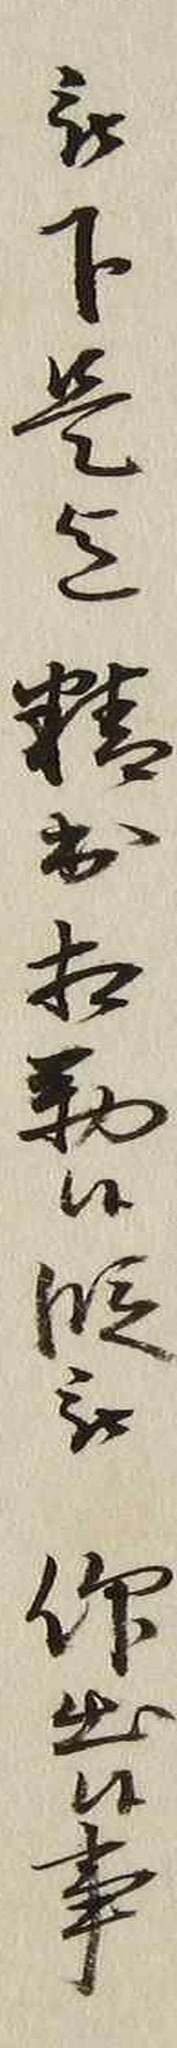被下是迄精出相勤候段被仰出候事
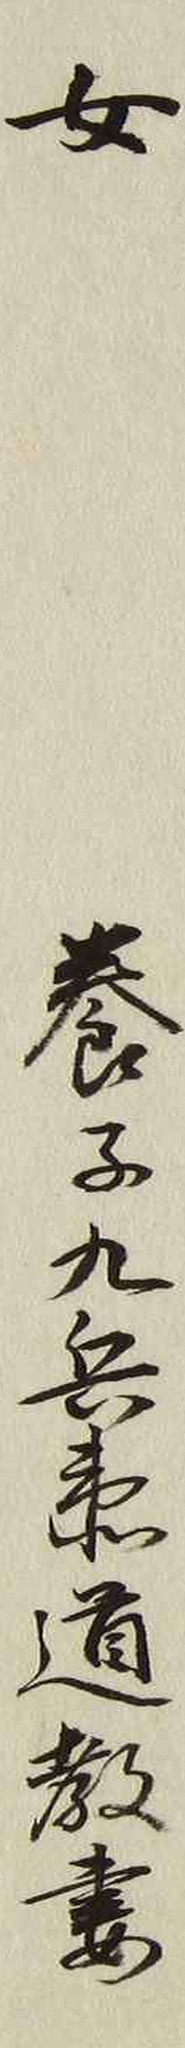女養子九兵衛道教妻
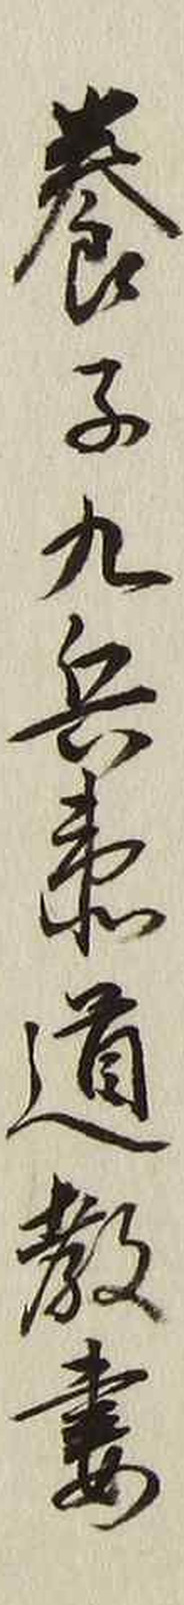女養子九兵衛道教妻
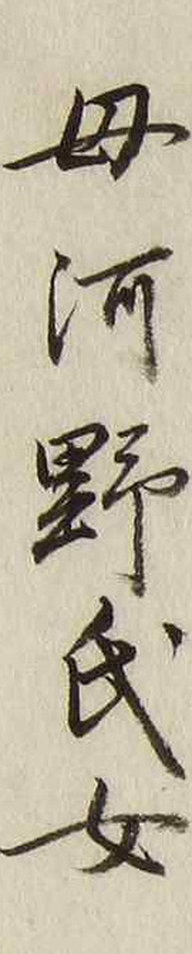母河野氏女

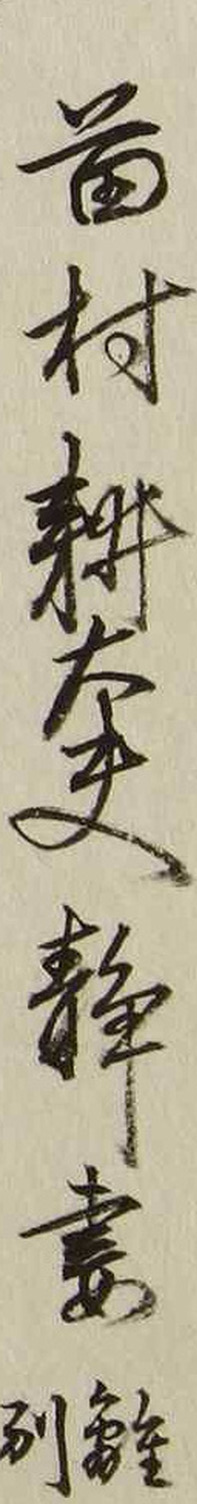苗村耕太夫静妻離別
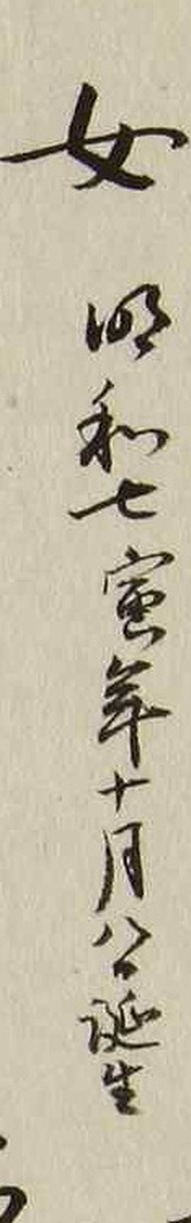女明和七寅年十月八日誕生
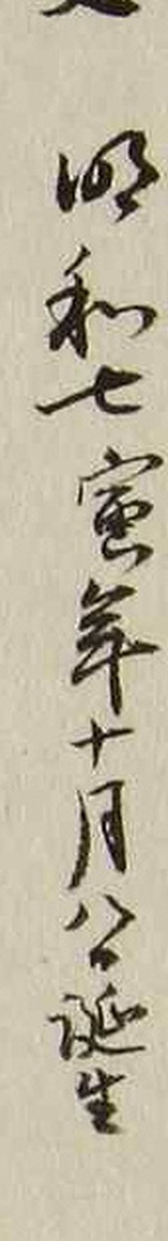女明和七寅年十月八日誕生
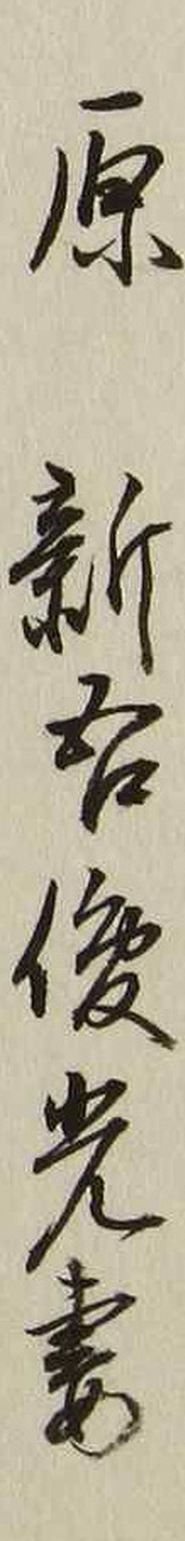原新吾俊光妻
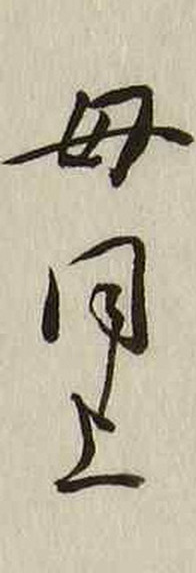母同上
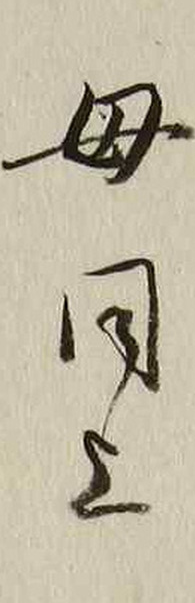母同上
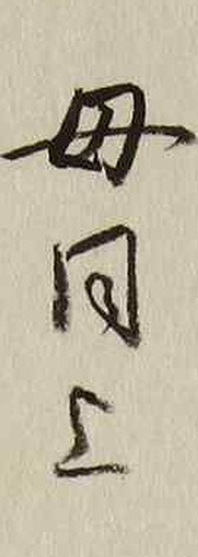母同上
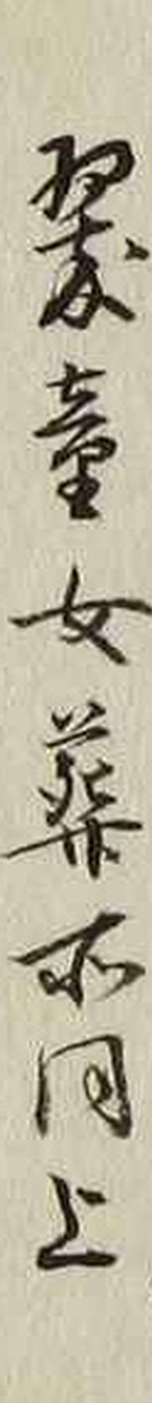翠童女葬所同上
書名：諸士系譜　巻之160　な之部2
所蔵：会津若松市立会津図書館
